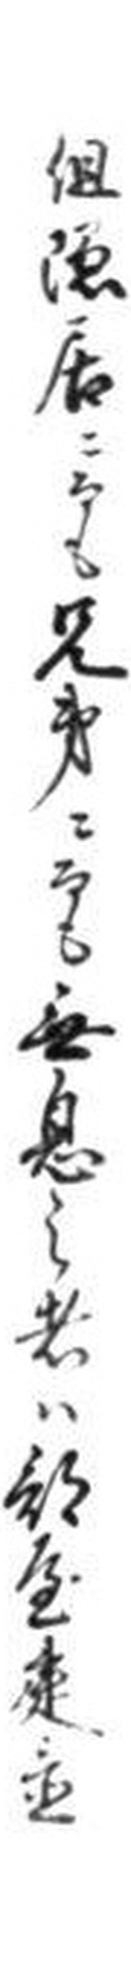但隠居ニ而も兄弟ニ而も無息之者ハ部屋建置
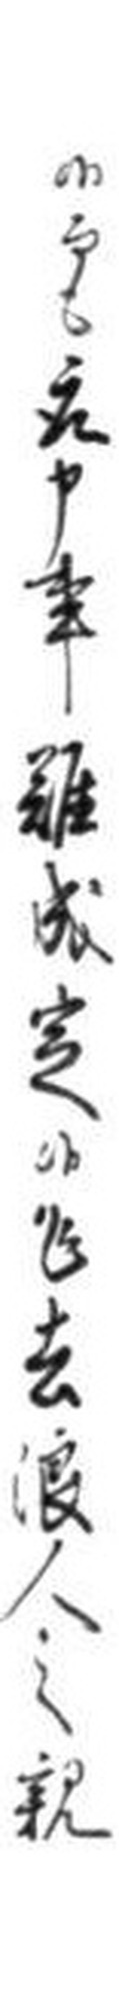候而も取申事難成定候乍去浪人之親
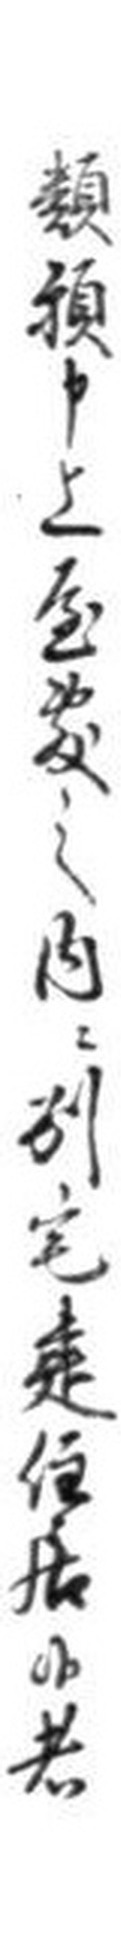類願申上屋敷之内ニ別宅建住居候者
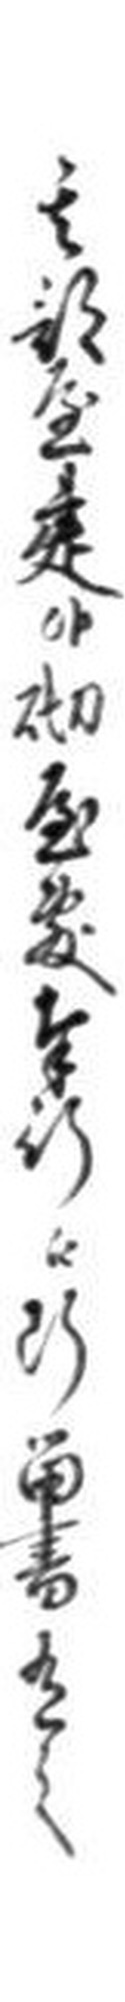其部屋建候砌屋敷奉行江断留書有之
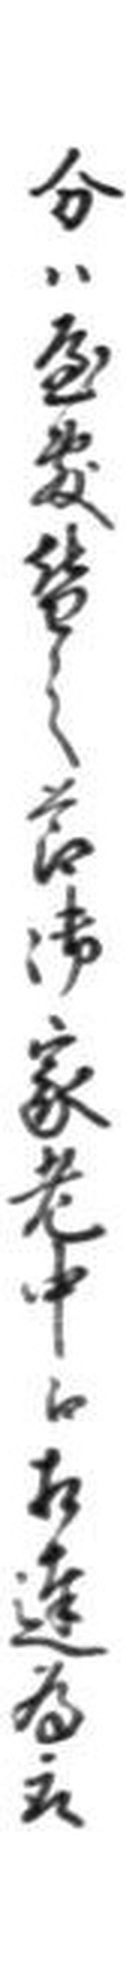分ハ屋敷替之節御家老中江相達為取
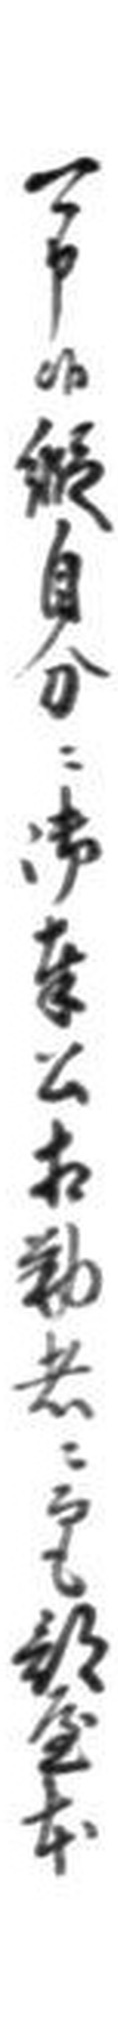可申候縦自分ニ御奉公相勤者ニ而も部屋本
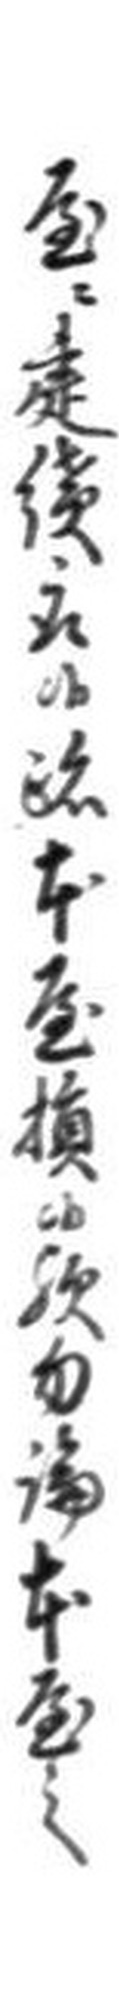屋ニ建続取候跡本屋損候歟勿論本屋之
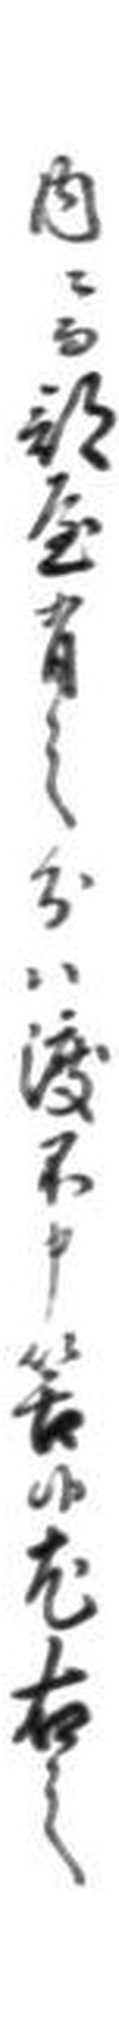内ニ而部屋有之分ハ渡不申筈候尤右之
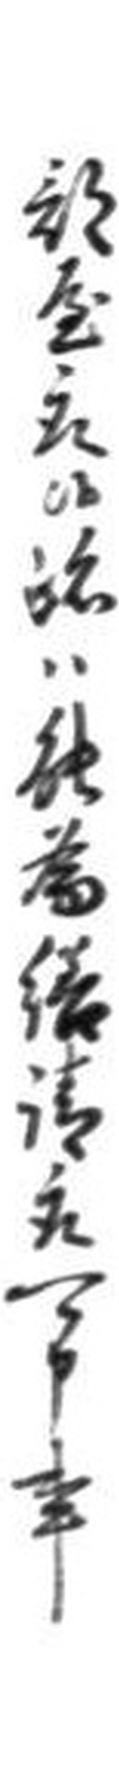部屋取候跡ハ能為繕請取可申事
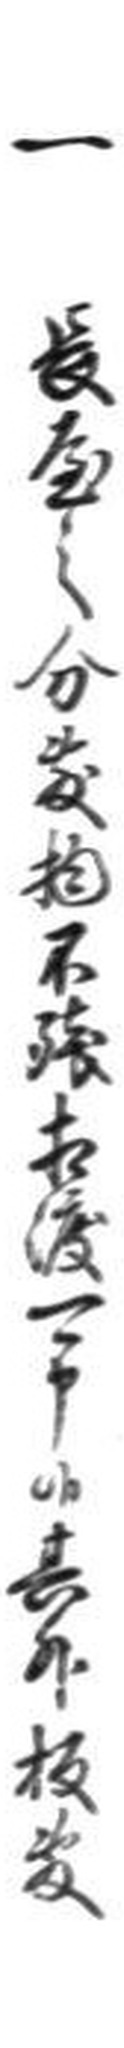一長屋之分敷物不残相渡可申候其外板敷
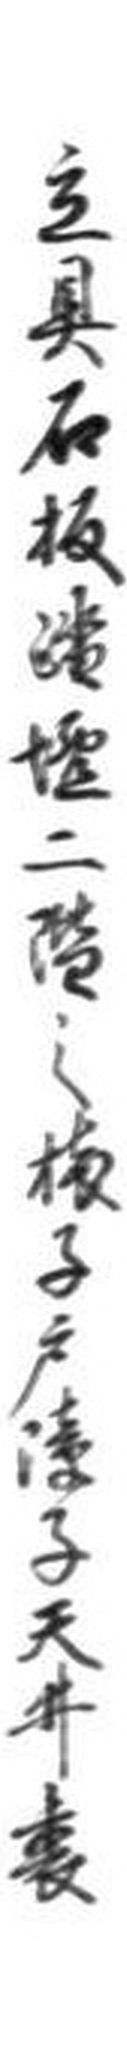立具石板踏壇二階之梯子戸障子天井裏
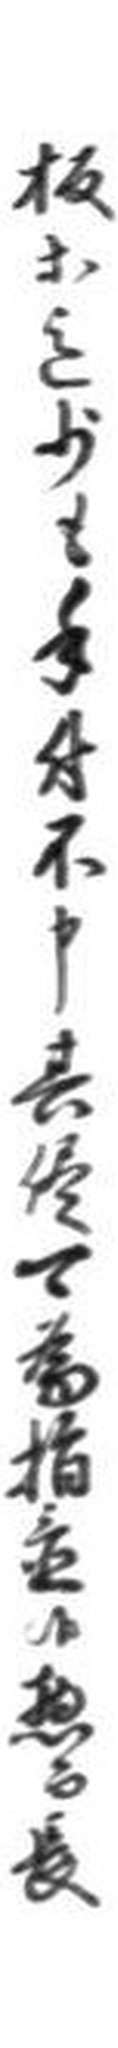板等迄少も手付不申其儘可為指置候惣而長
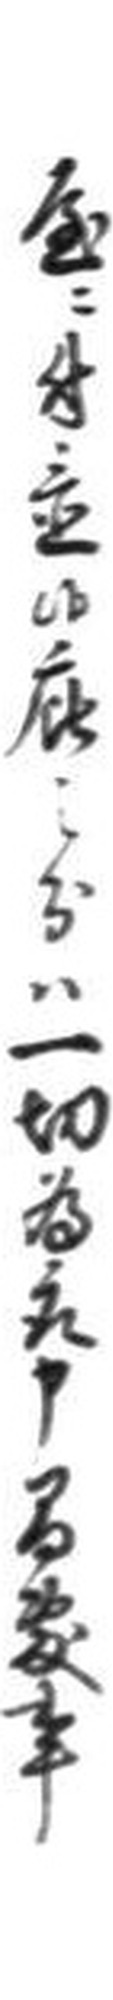屋ニ付置候庇之分ハ一切為取申間敷事

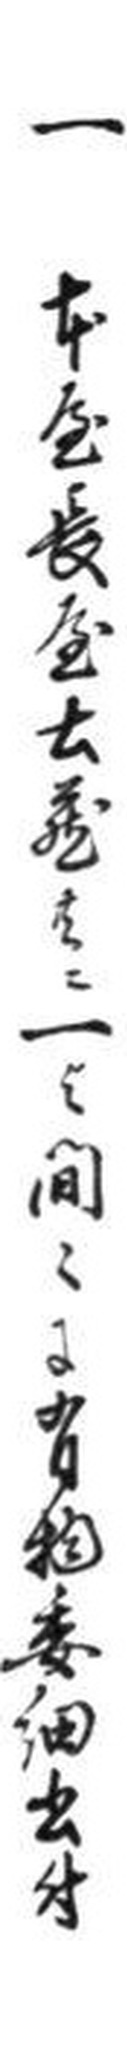一本屋長屋土蔵共ニ一与間々に有物委細書付
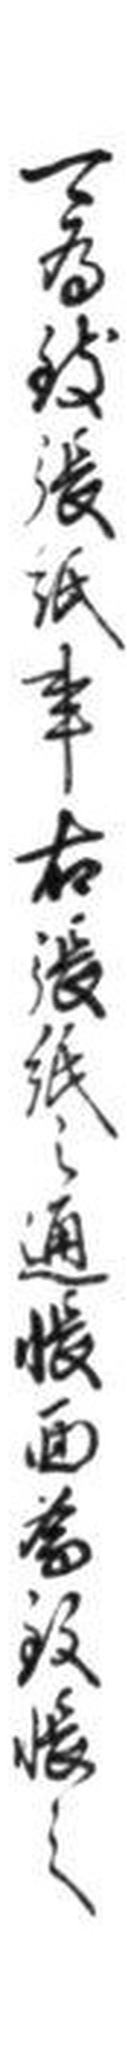可為致張紙事右張紙之通帳面為致帳之
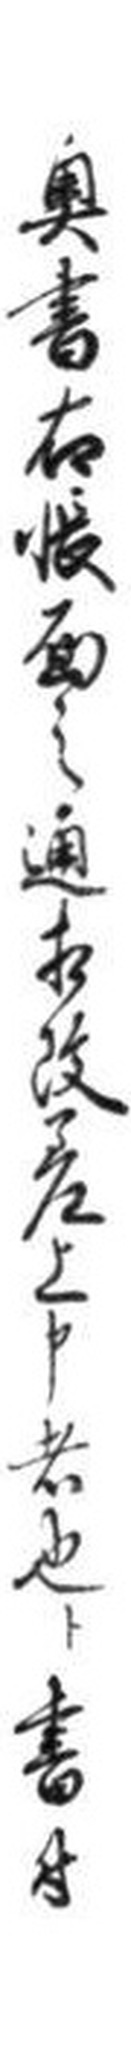奥書右帳面之通相改差上申者也ト書付
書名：家譜 三十二 吉邦公 従享保二年到享保三年
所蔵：福井県文書館 Fukui Prefectural Archives
